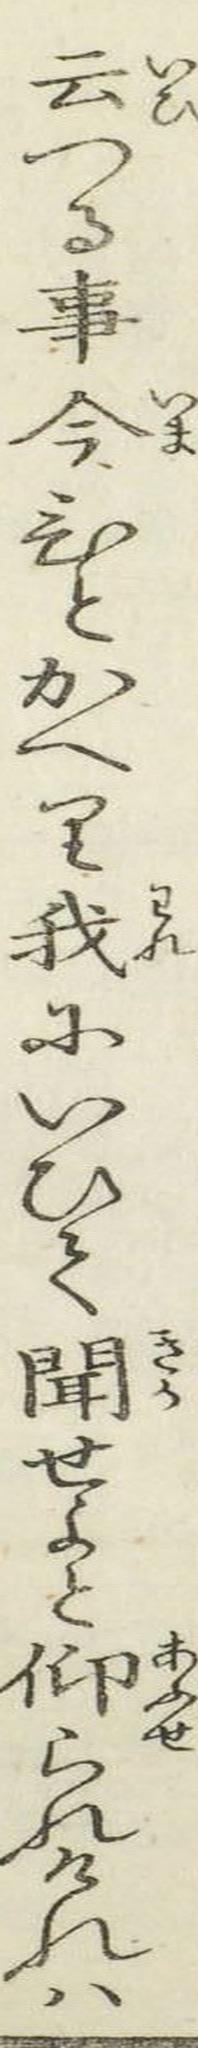云つる事今ひとかへり我にいひて聞せよと仰られけれは
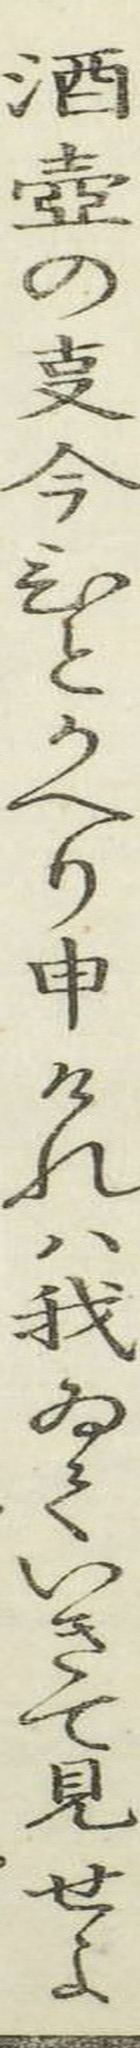酒壺の事今ひとかへり申けれは我ゐていきて見せよ
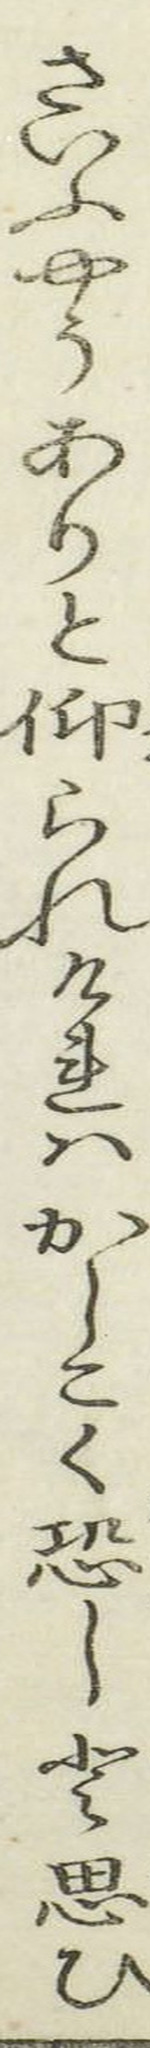さいふやうありと仰られけれはかしこく恐しと思ひ
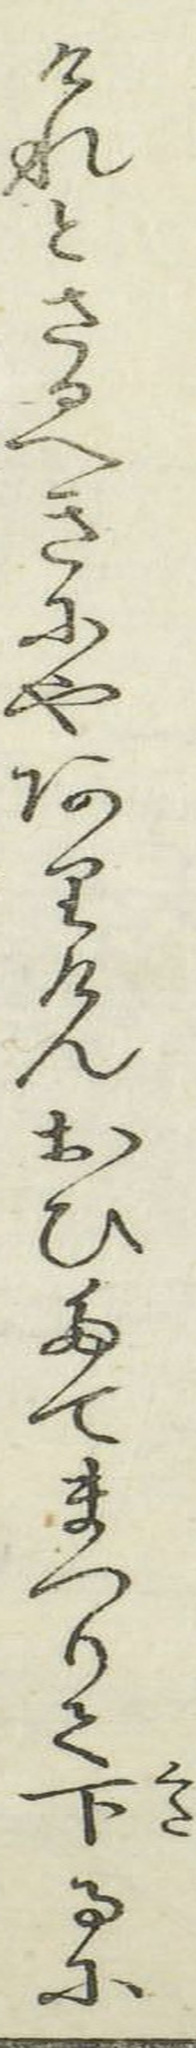けれとさるへきにやありけんおひたてまつりて下るに
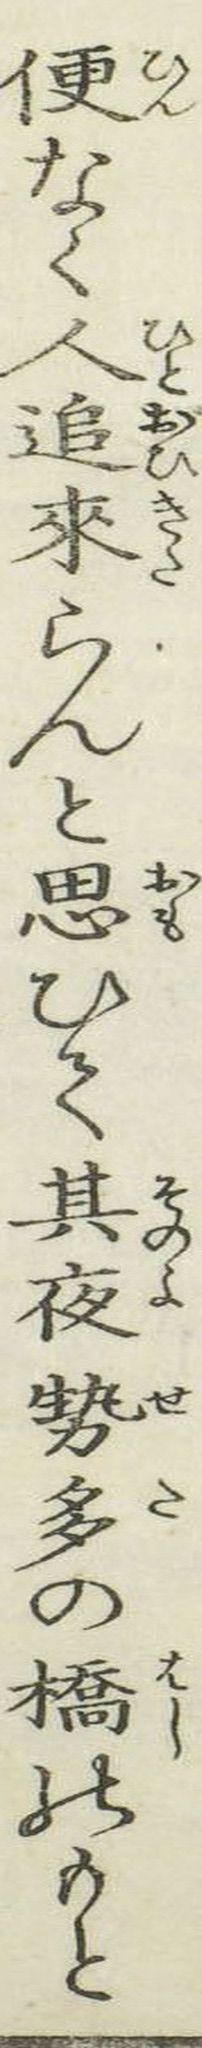便なく人追来らんと思ひて其夜勢多の橋のもと
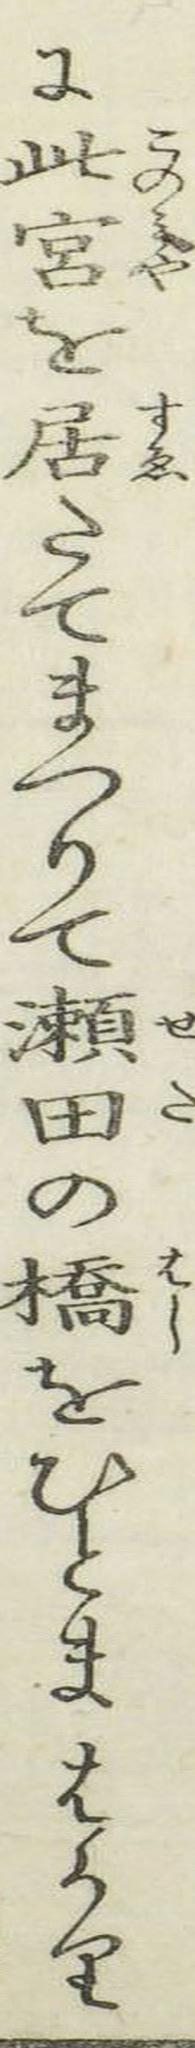に此宮を居たてまつりて瀬田の橋をひとまはかり
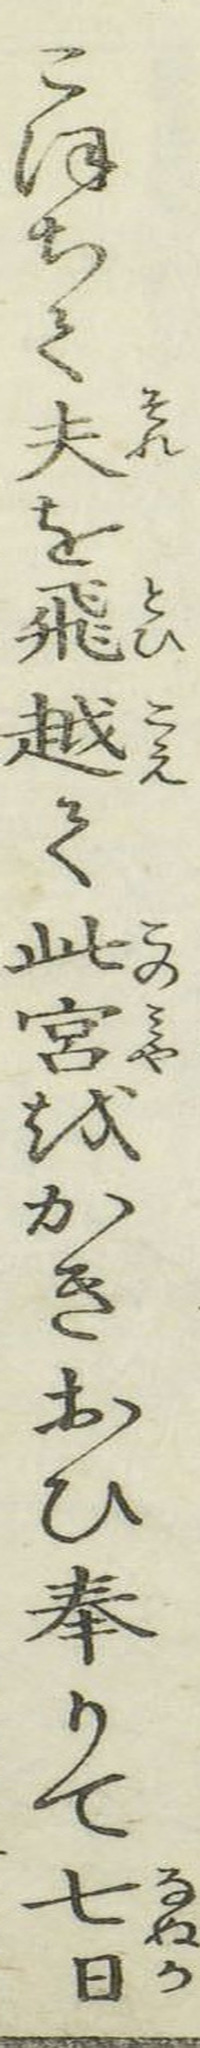こほちて夫を飛越て此宮をかきおひ奉りて七日
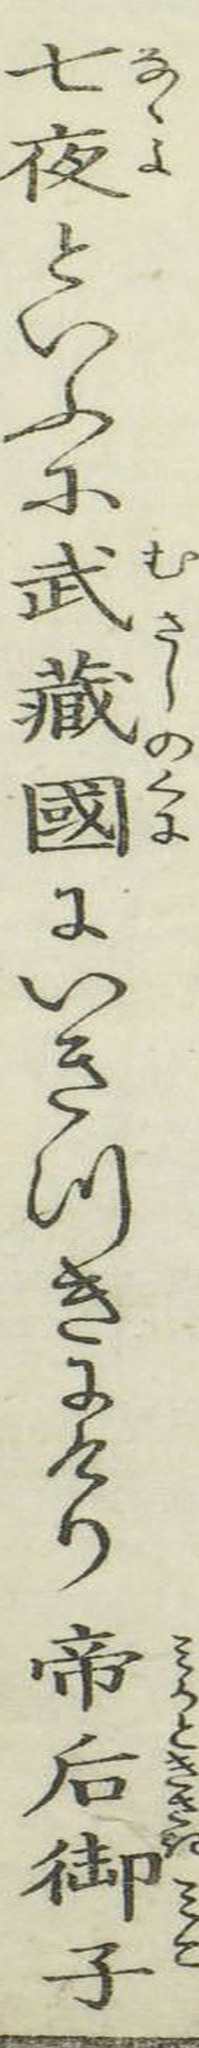七夜といふに武蔵國にいきつきにけり帝后御子
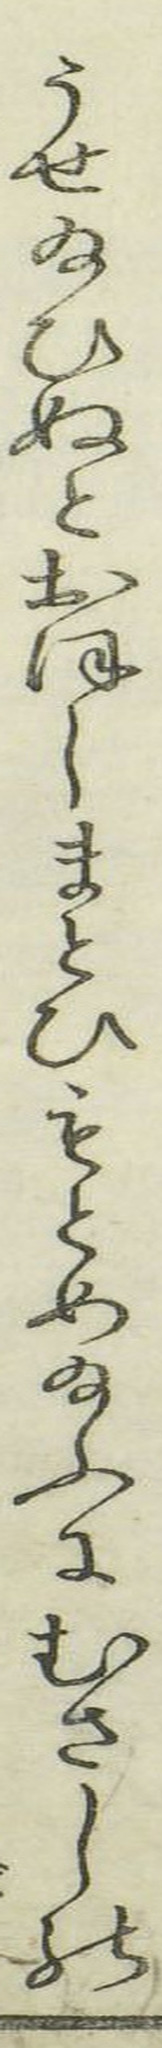うせ給ひぬとおほしまとひもとめ給ふにむさしの
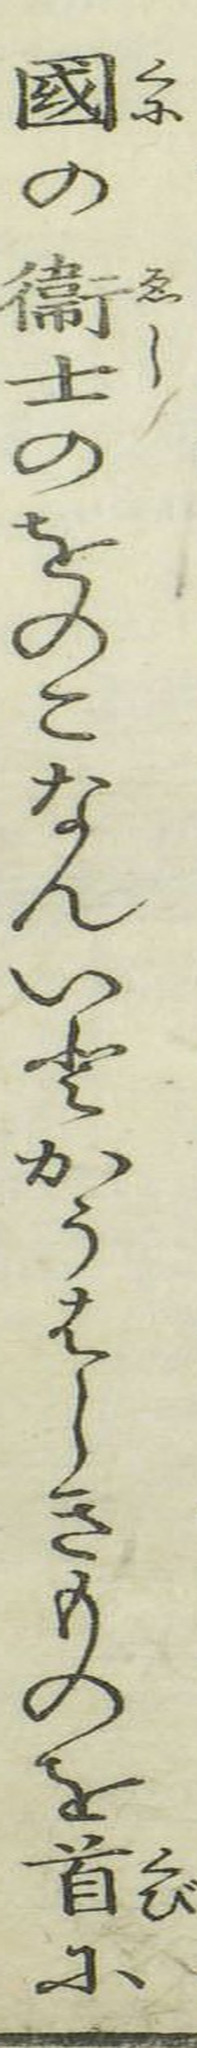國の衛士のをのこなんいとかうはしきものを首に

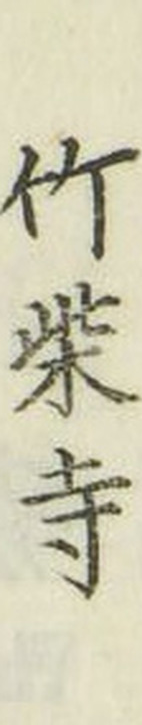竹柴寺

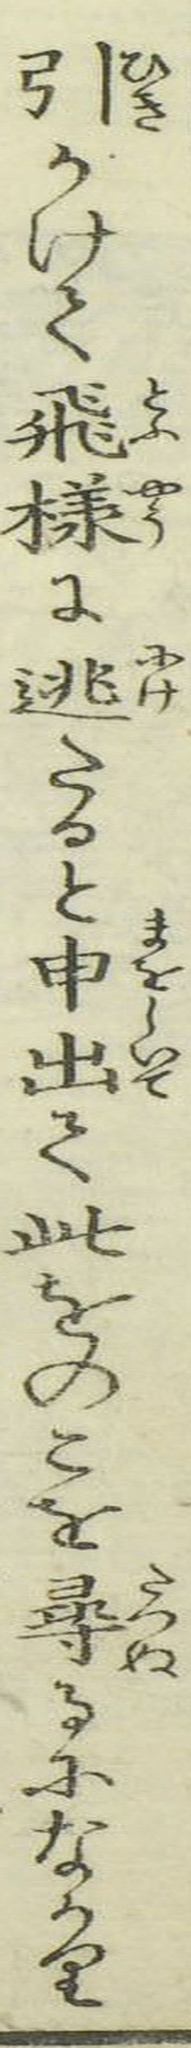引かけて飛様に逃たると申出て此をのこを尋るになかり
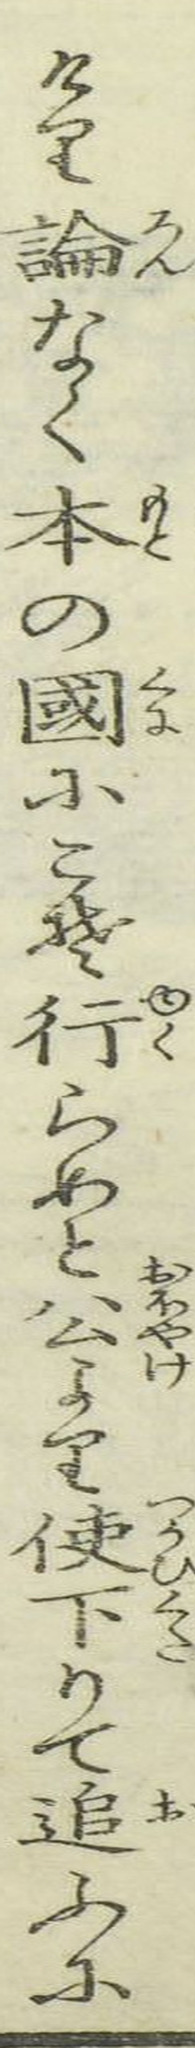けり論なく本の國にこそ行らめと公より使下りて追ふに
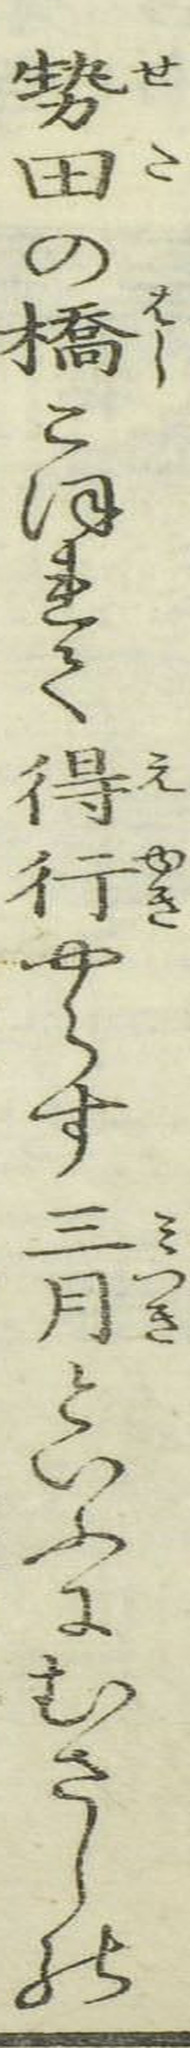勢田の橋こほれて得行やらす三月といふにむさしの
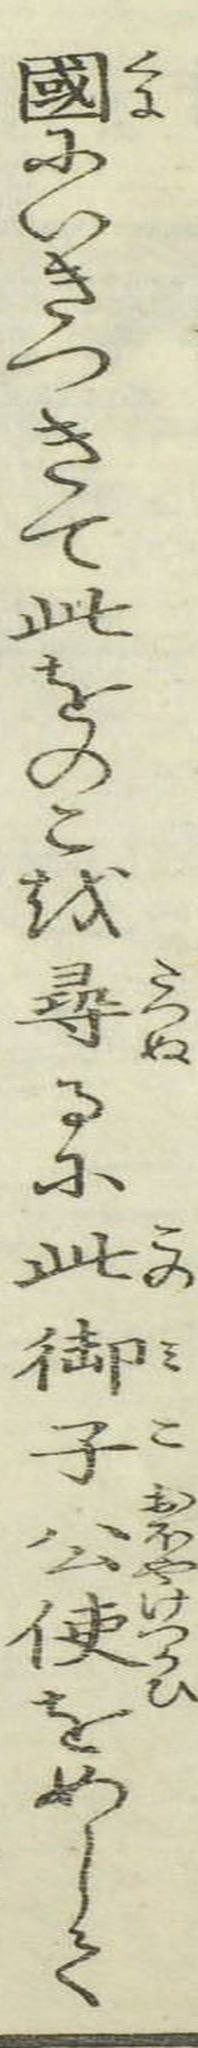國にいきつきて此をのこを尋るに此御子公使をめして
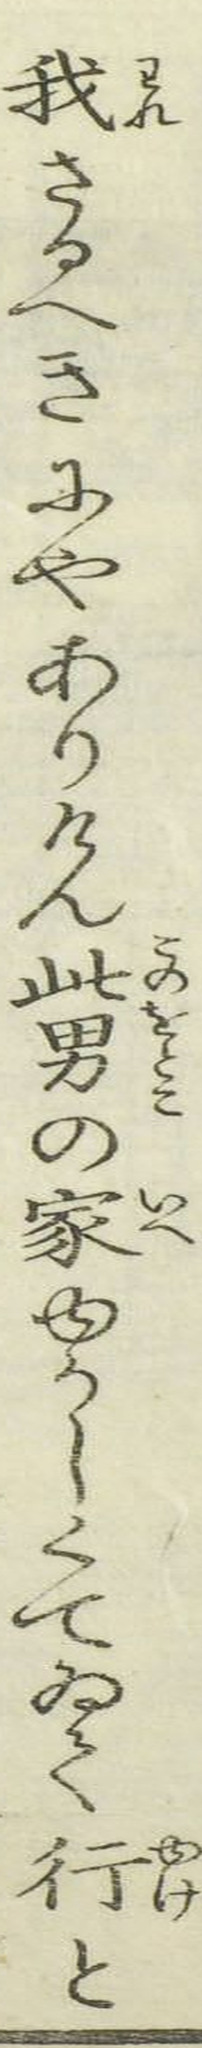我さるへきにやありけん此男の家ゆかしくてゐて行と
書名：江戸名所図会 20巻 巻之3
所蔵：東京学芸大学教育コンテンツアーカイブ
